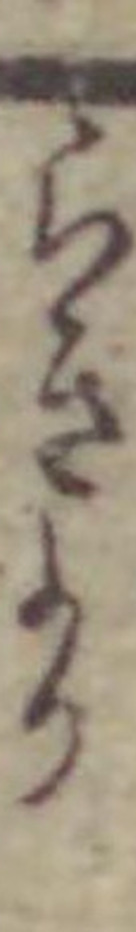らきより
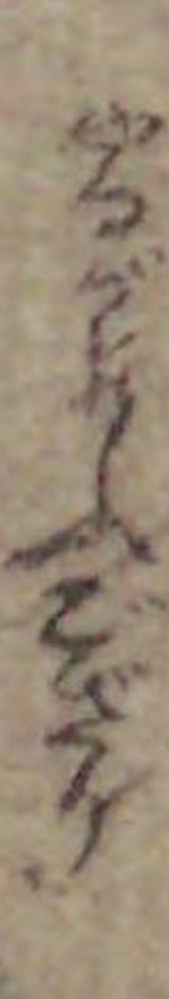やるがよふござり
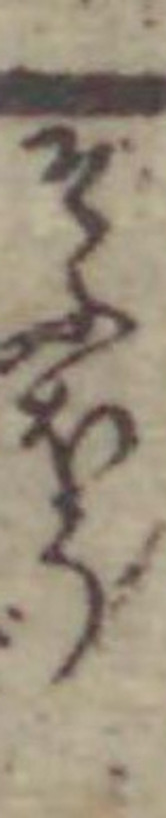そうほう
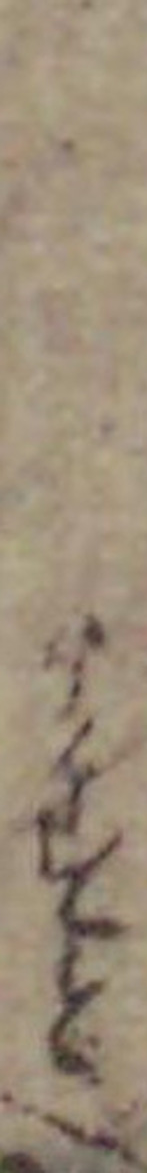ますと
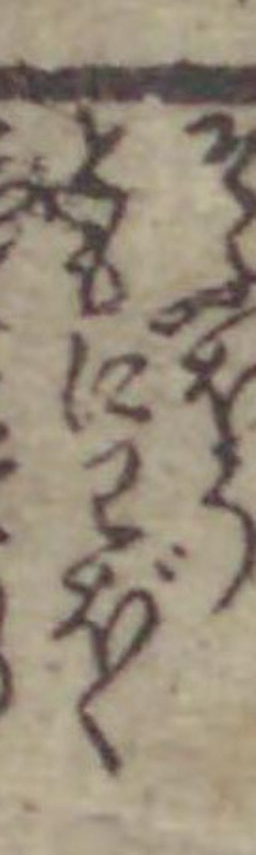ともにわぼく
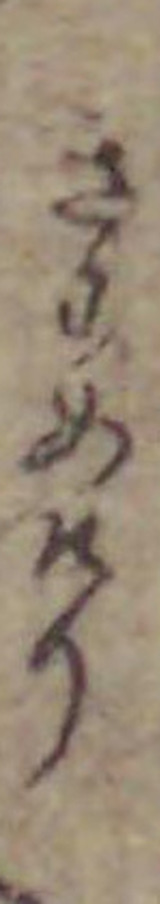きわめけり
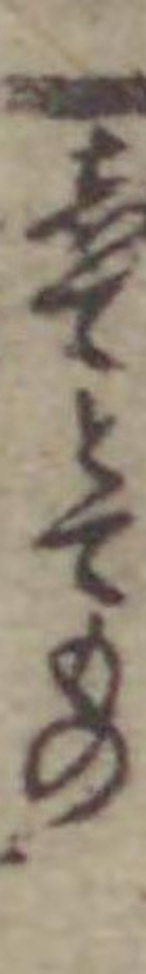してとてもの
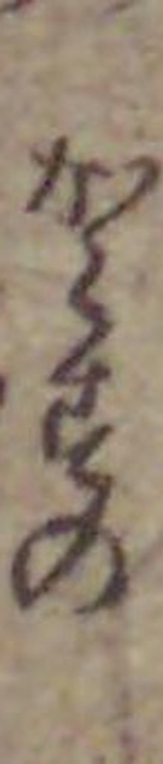からすの
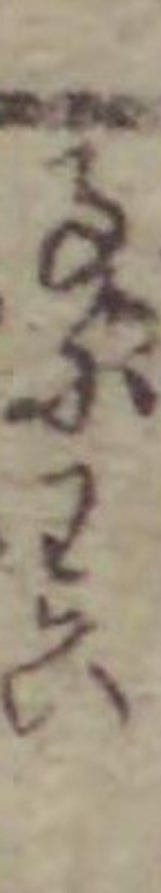事にわかい
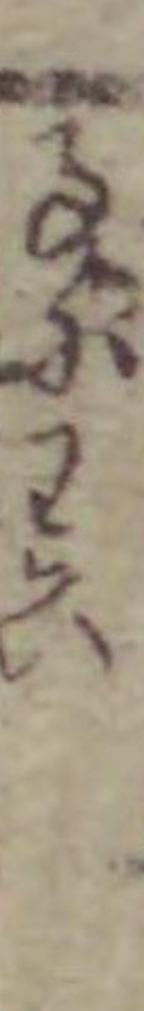事にわかい
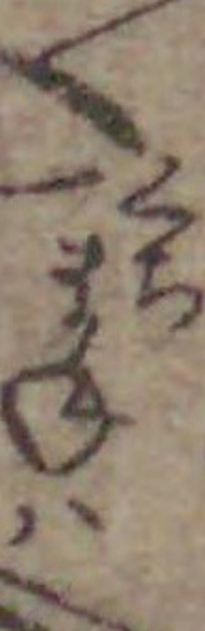まねハ
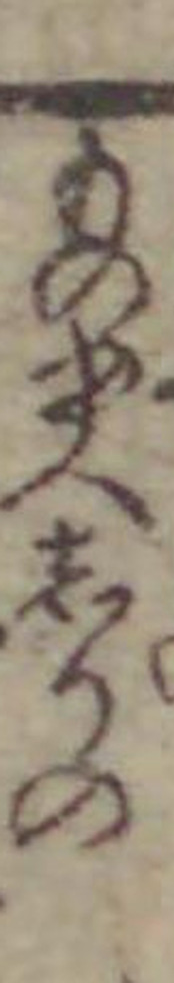ものゆへしりの
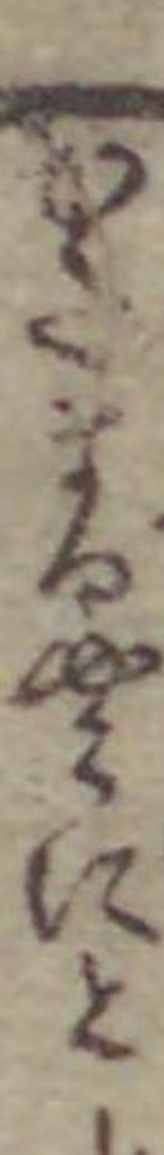かたまるやうにと
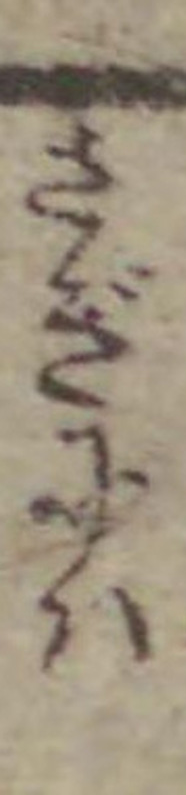さぎにハ
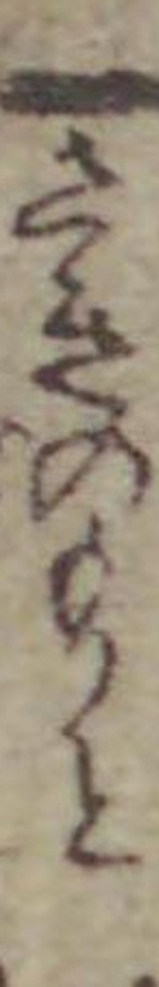さきのもりと
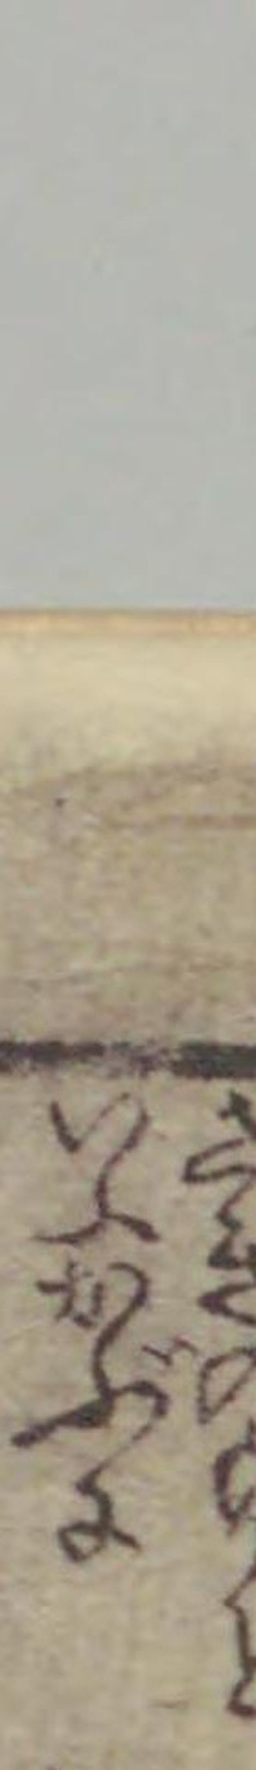いふかぶに
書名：烏行水諺草 3巻
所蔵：国立国会図書館 National Diet Library, JAPAN
